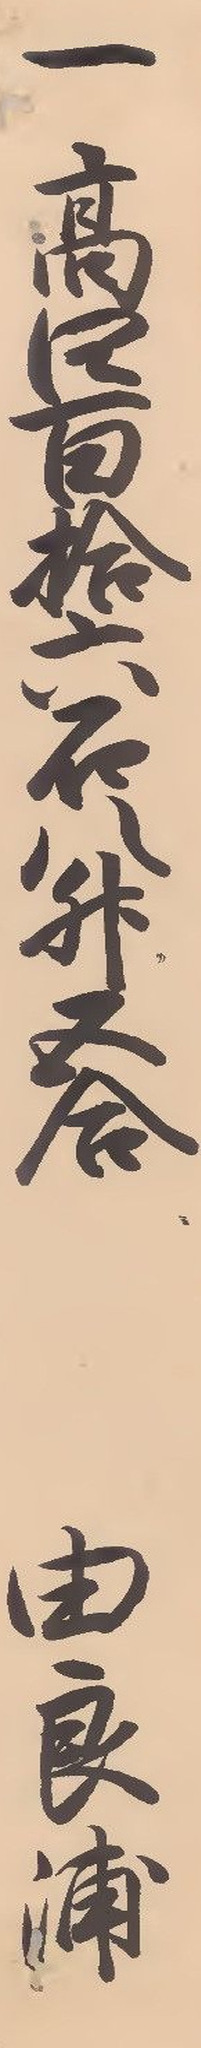一高四百拾六石八升五合由良浦
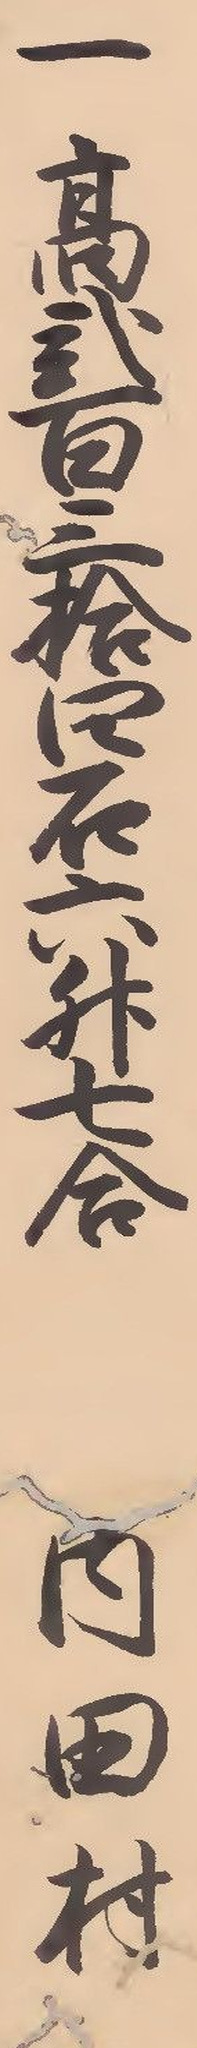一高弐百三拾四石六升七合内田村

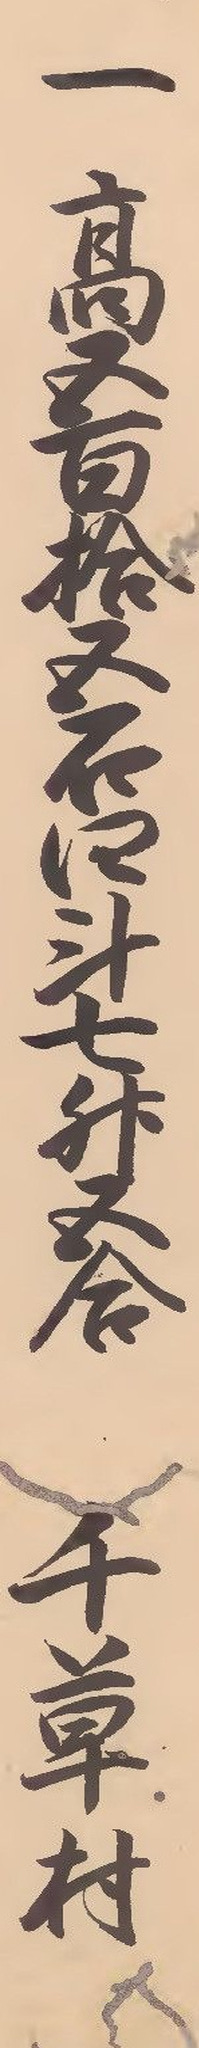一高五百拾五石四斗七升五合千草村
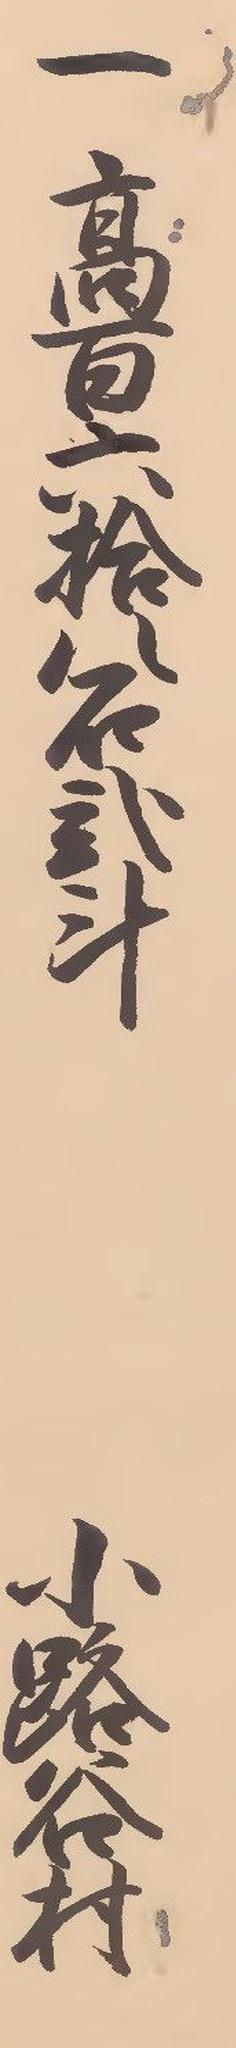一高百六拾八石弐斗小路谷村
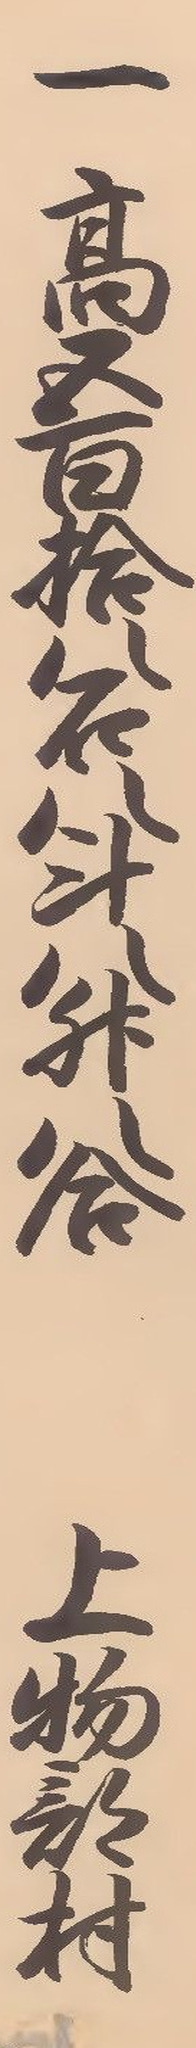一高五百拾八石八斗八升八合上物部村
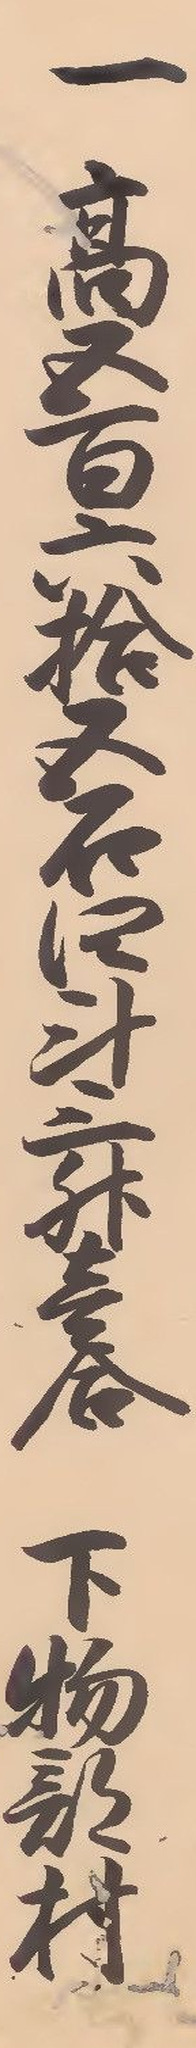一高五百六拾五石四斗三升壱合下物部村
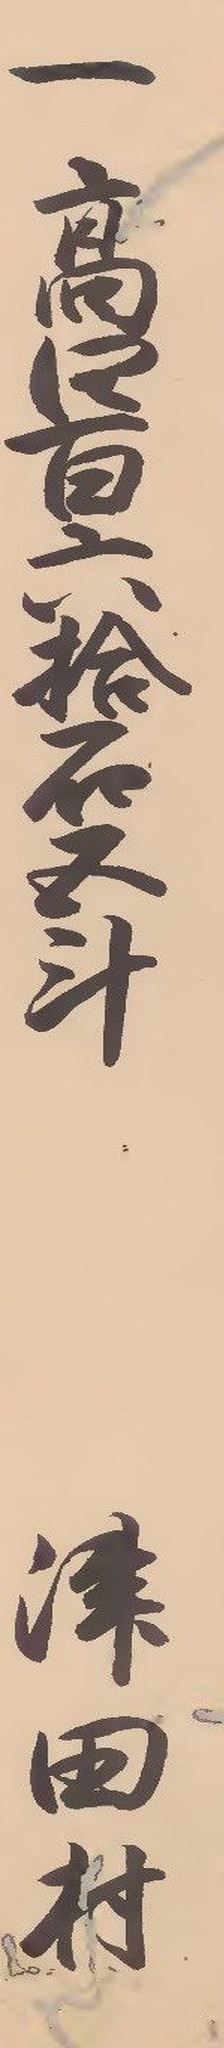一高四百六拾石五斗津田村
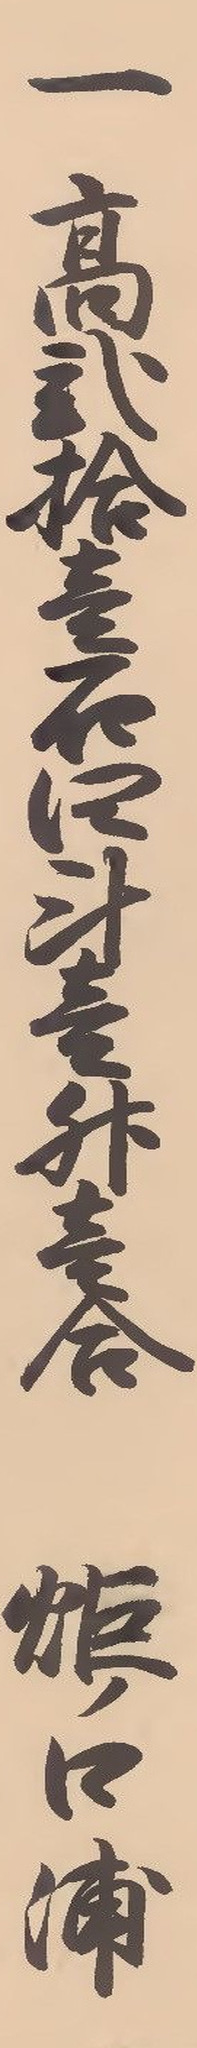一高弐拾壱石四斗壱升壱合炬ノ口浦
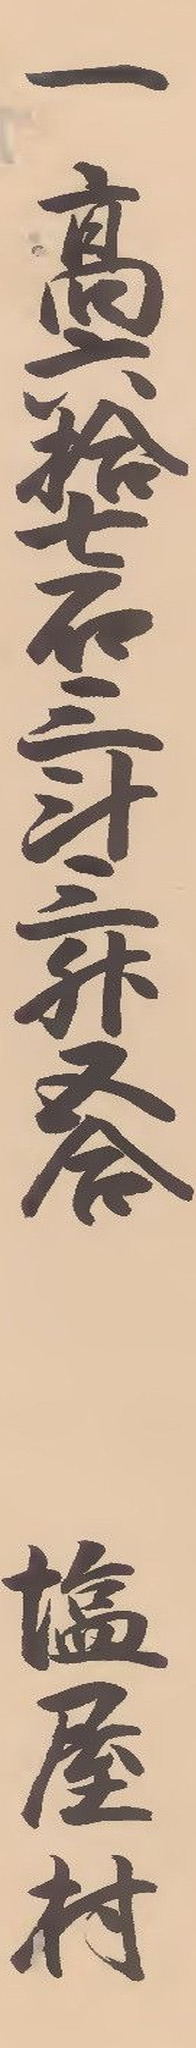一高六拾七石三斗三升五合塩屋村
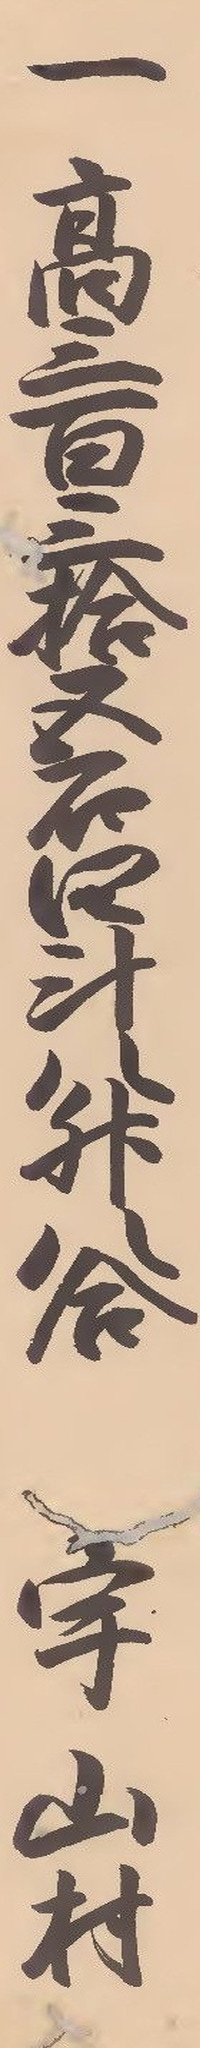一高三百三拾五石四斗八升八合宇山村

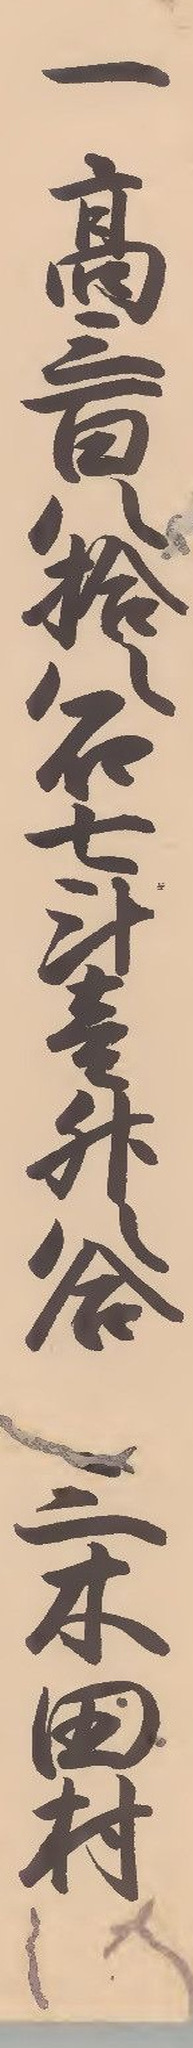一高三百八拾八石七斗壱升八合三木田村
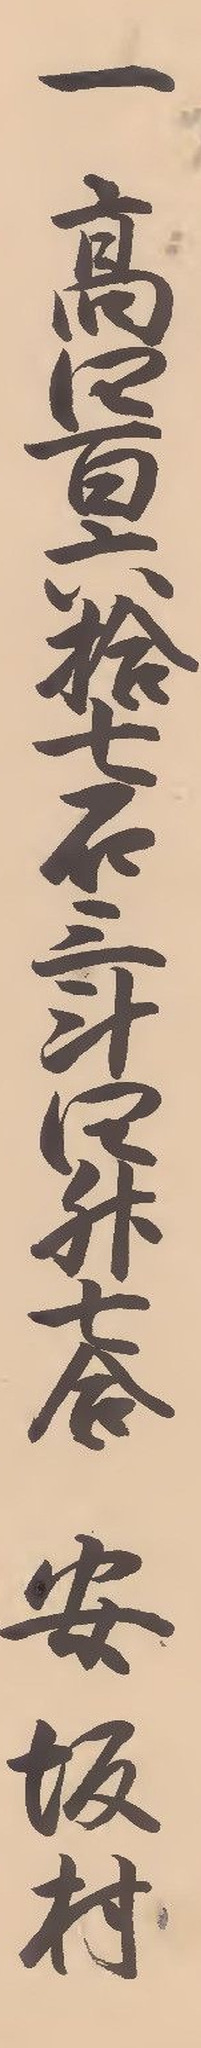一高四百六拾七石三斗四升七合安坂村
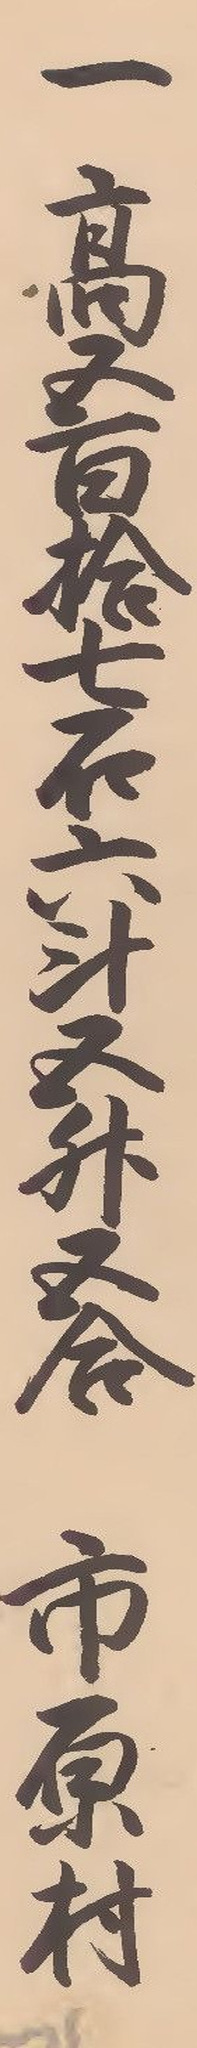一高五百拾七石六斗五升五合市原村
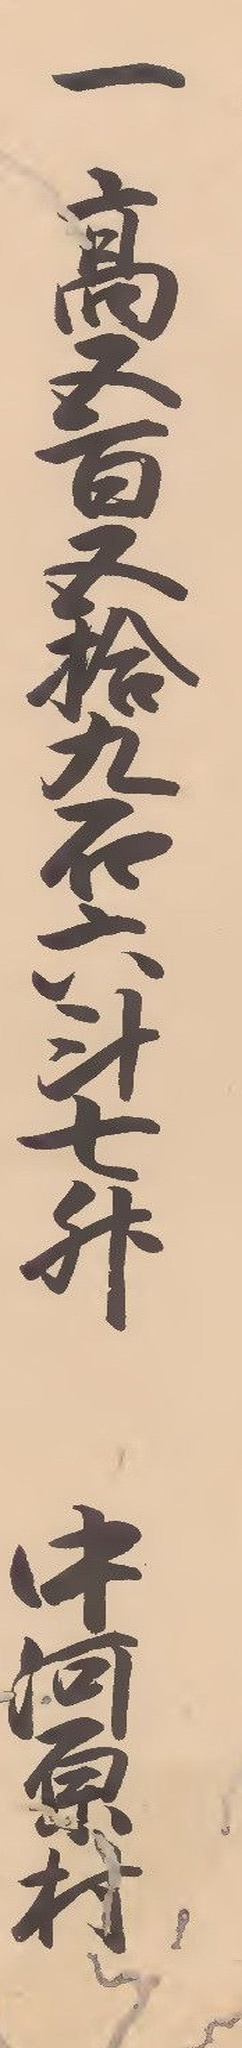一高五百五拾九石六斗七升中河原村
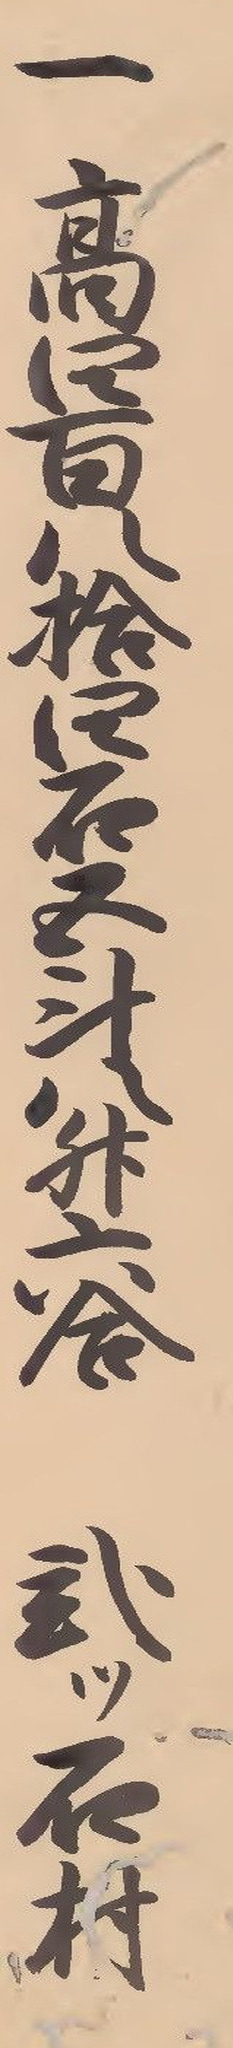一高四百八拾四石五斗八升六合弐ツ石村
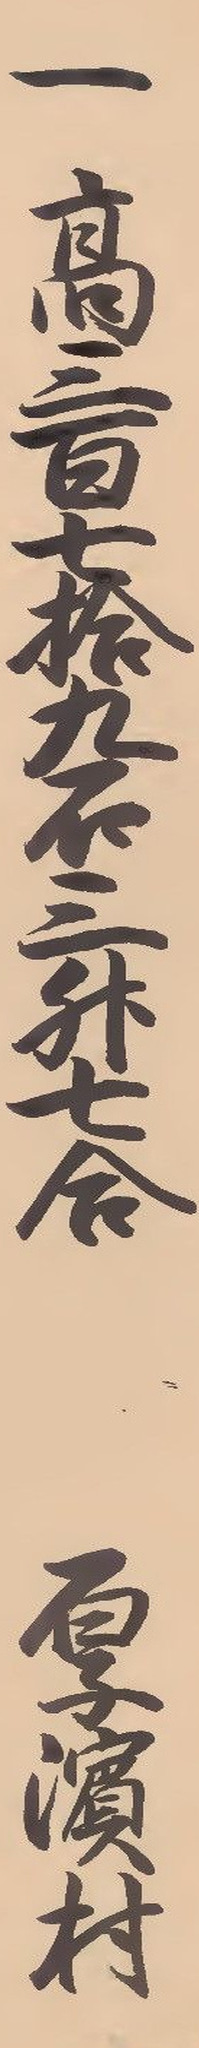一高三百七拾九石三升七合厚浜村
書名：淡路国郷帳
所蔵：国立公文書館 National Archives of Japan
